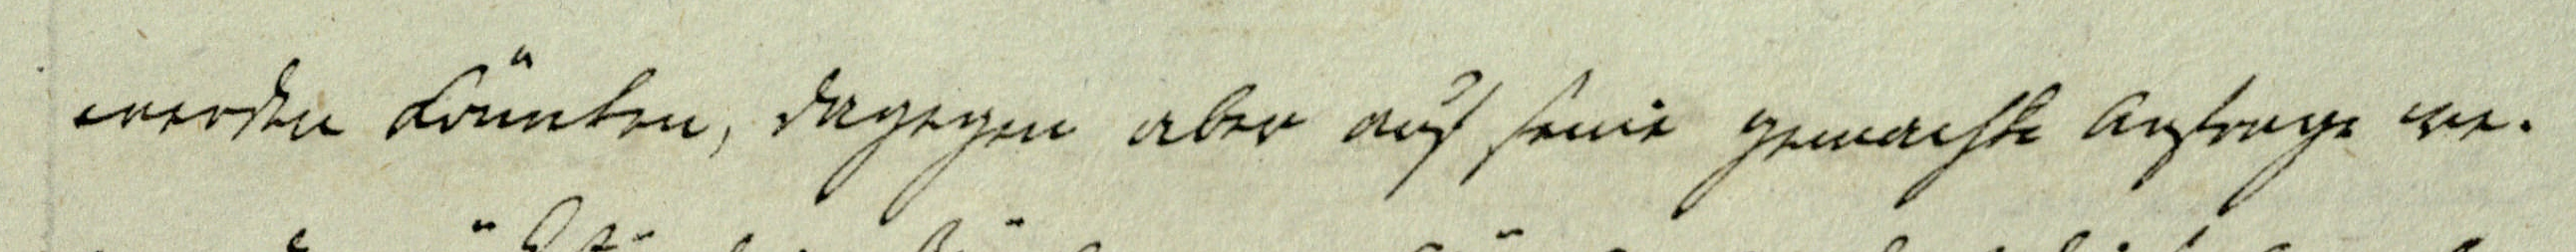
werden könnten, dagegen aber auf seine gemachte Anfrage we¬
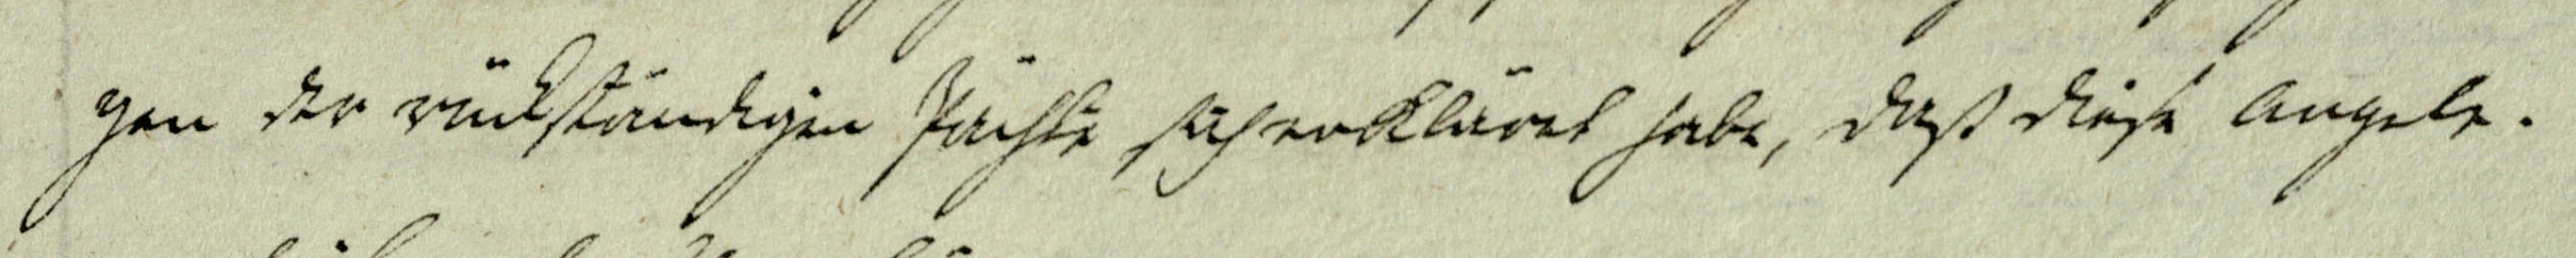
gen der rückständigen Pächte sich erkläret habe, daß diese Angele¬
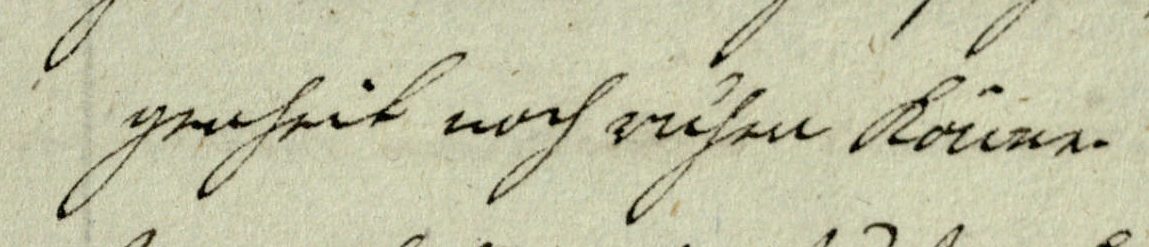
genheit noch ruhen könne.
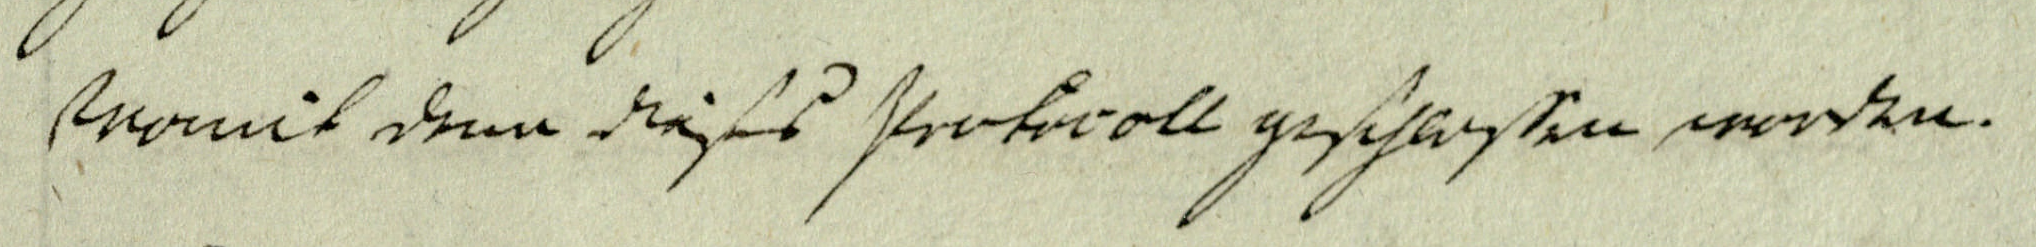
Womit denn dieses Protocoll geschlossen worden.
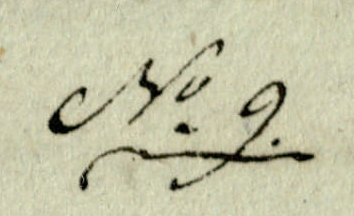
No 9.
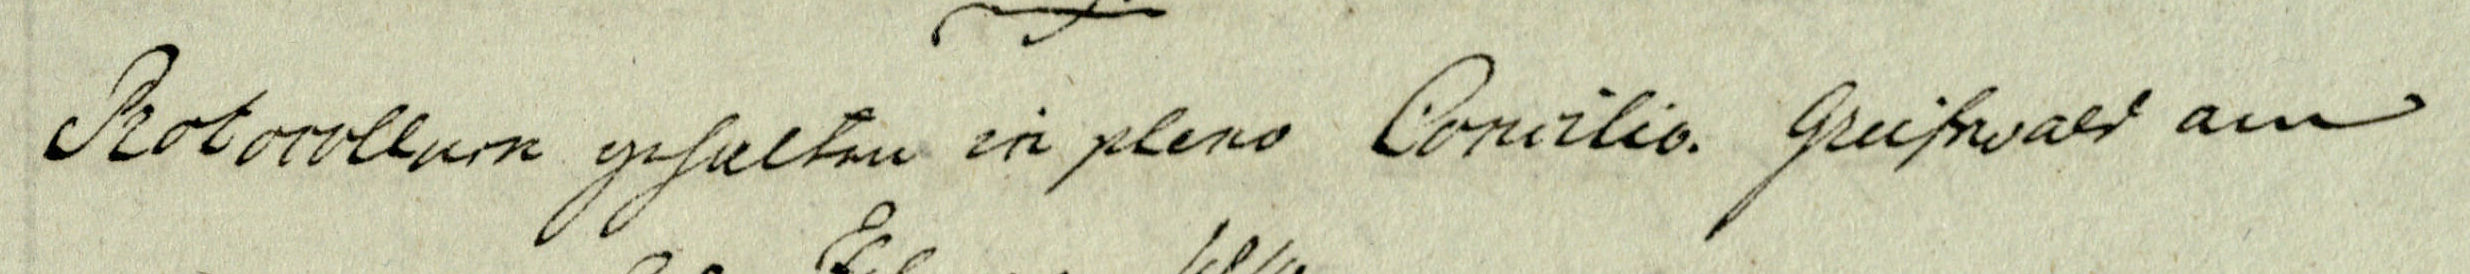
Protocollum gehalten in pleno Concilio. Greifswald am
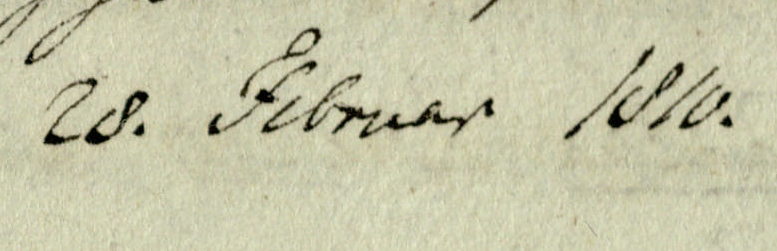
28. Februar 1810.
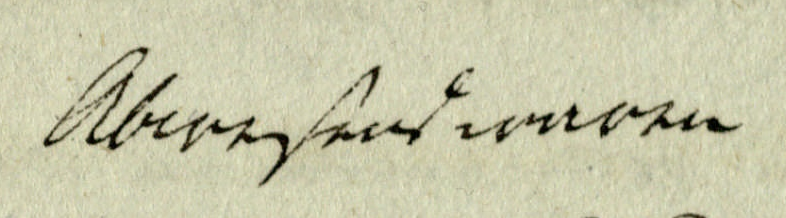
Abwesend waren
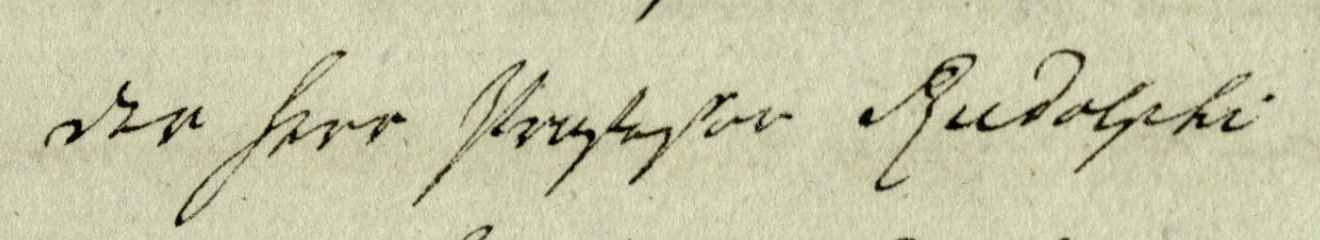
der Herr Professor Rudolphi
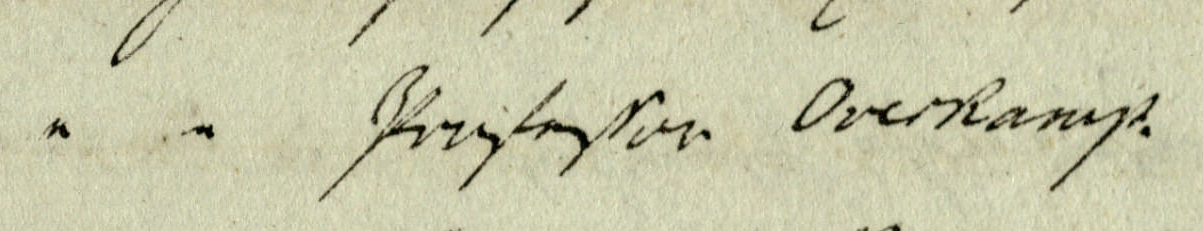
Professor Overkamp.
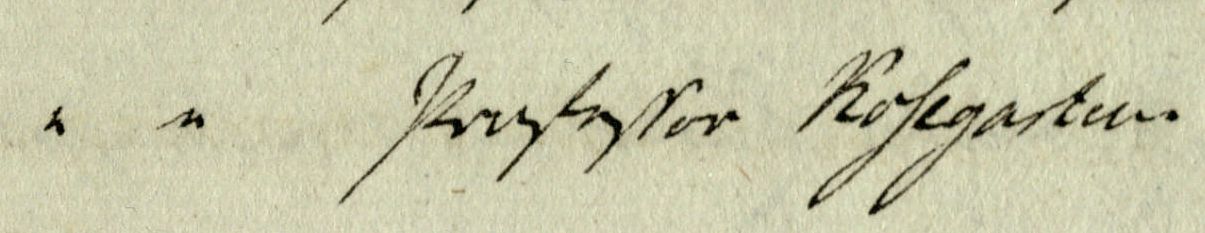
Professor Kosegarten.
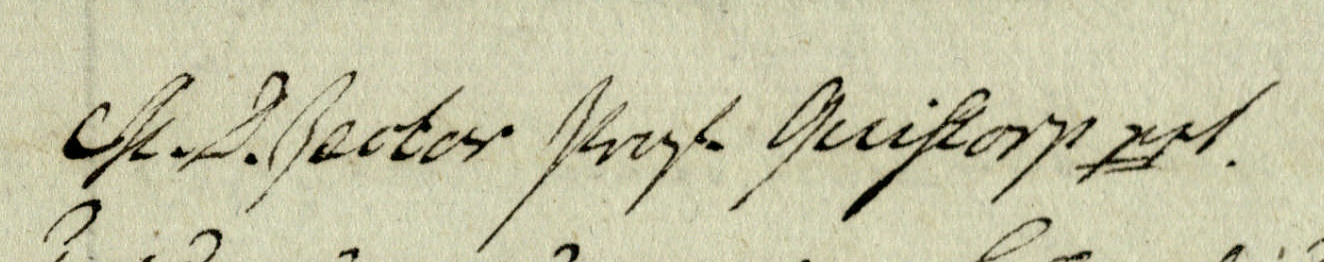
M. D Rector Prof. Quistorp ppt.
